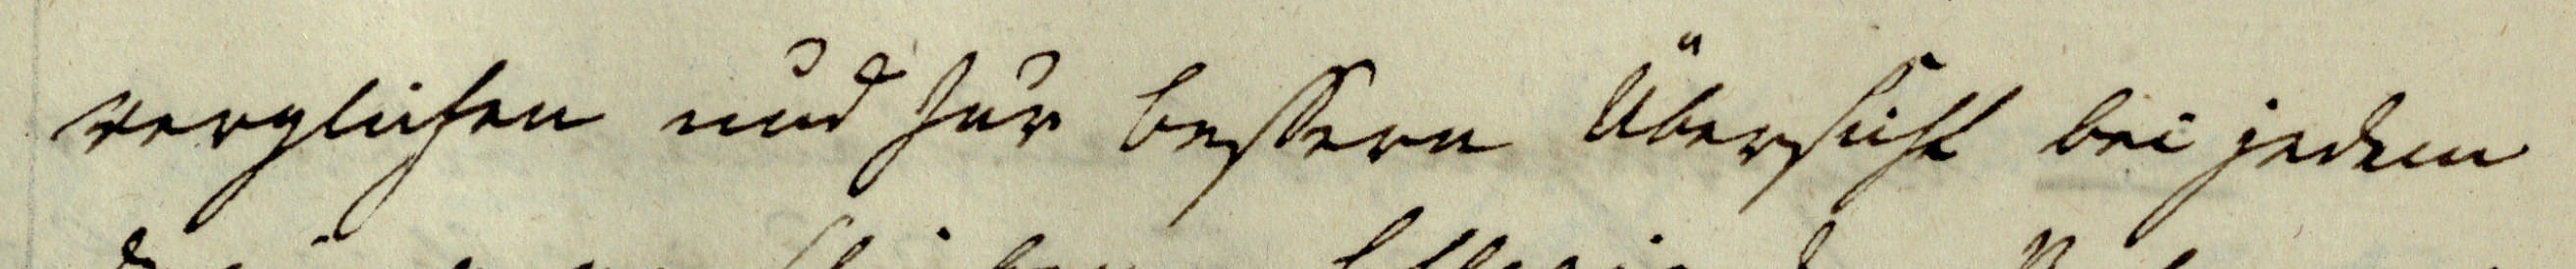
verglichen und zur bessern Übersicht bei jedem
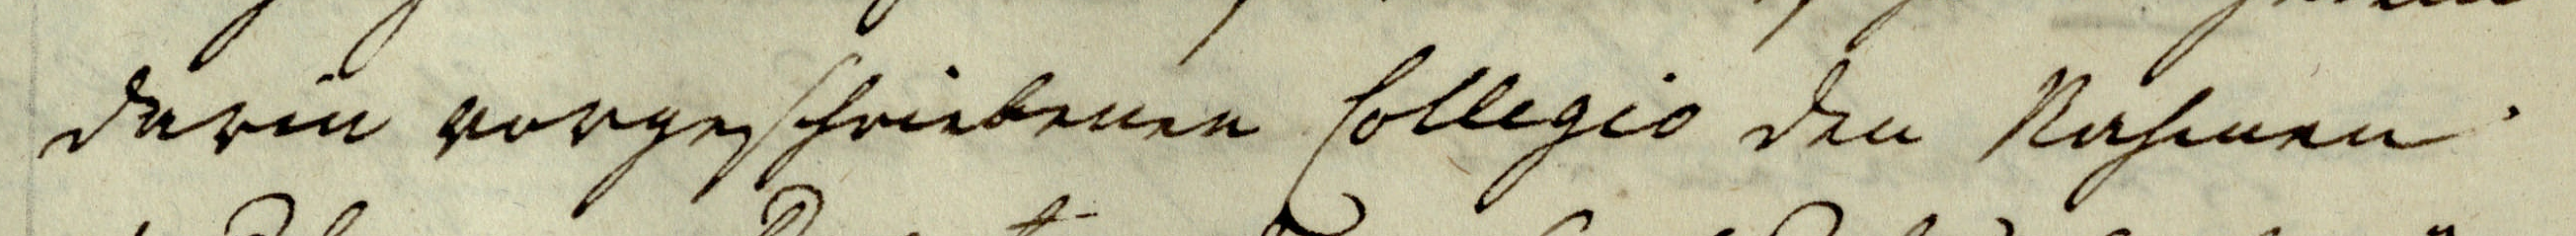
darin vorgeschriebenen Collegio den Nahmen
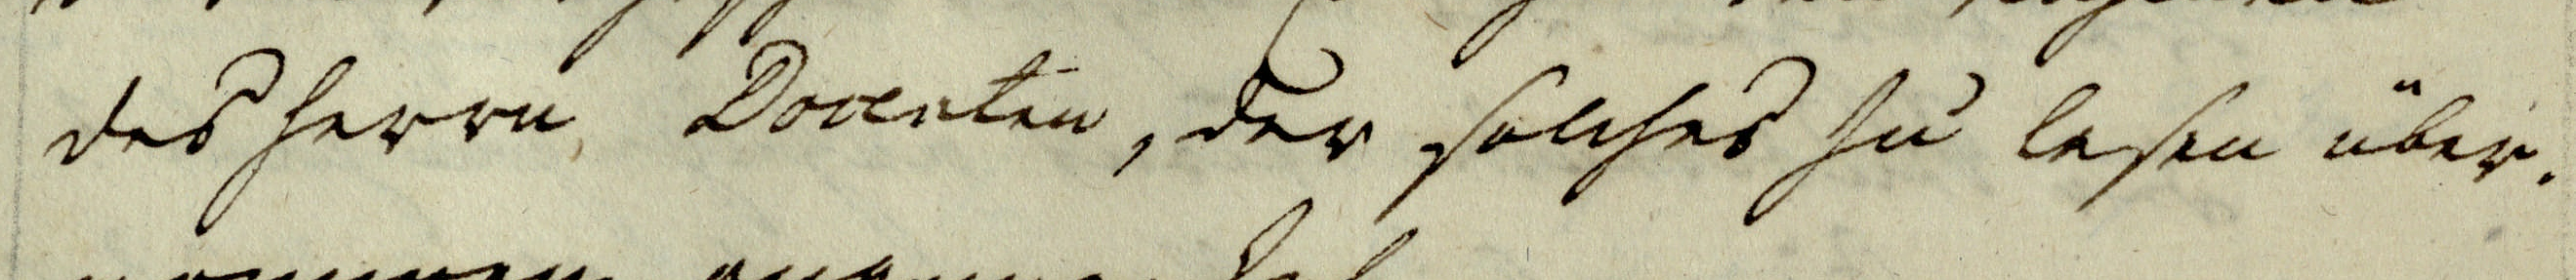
des Herrn Docenten, der solches zu lesen über¬
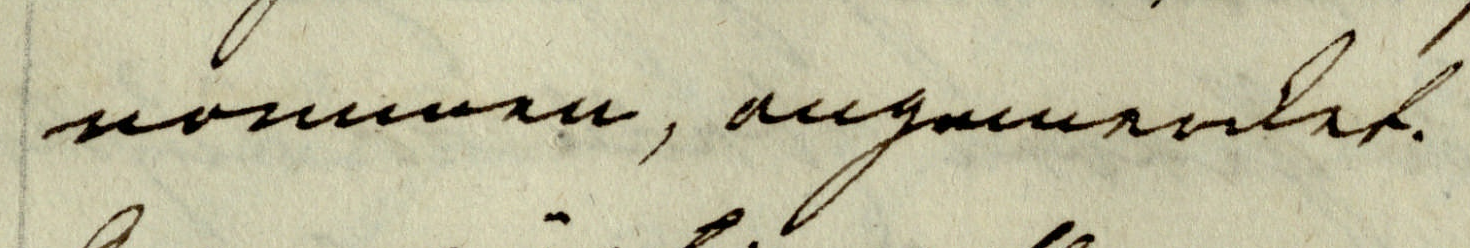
nommen, angemercket.
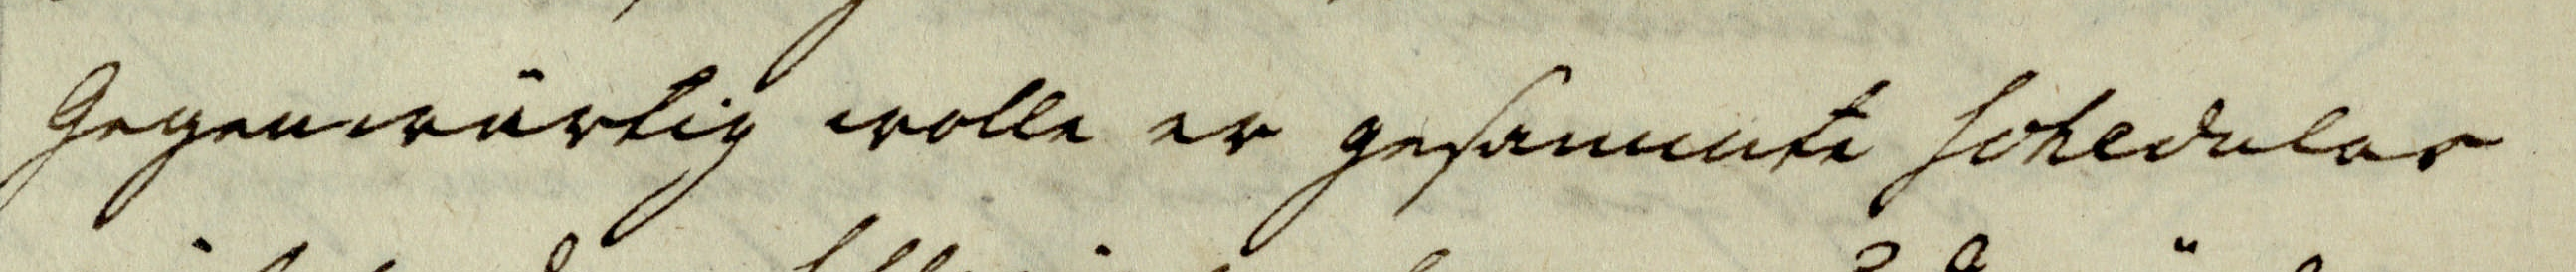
Gegenwärtig wolle er gesammte Schedulas
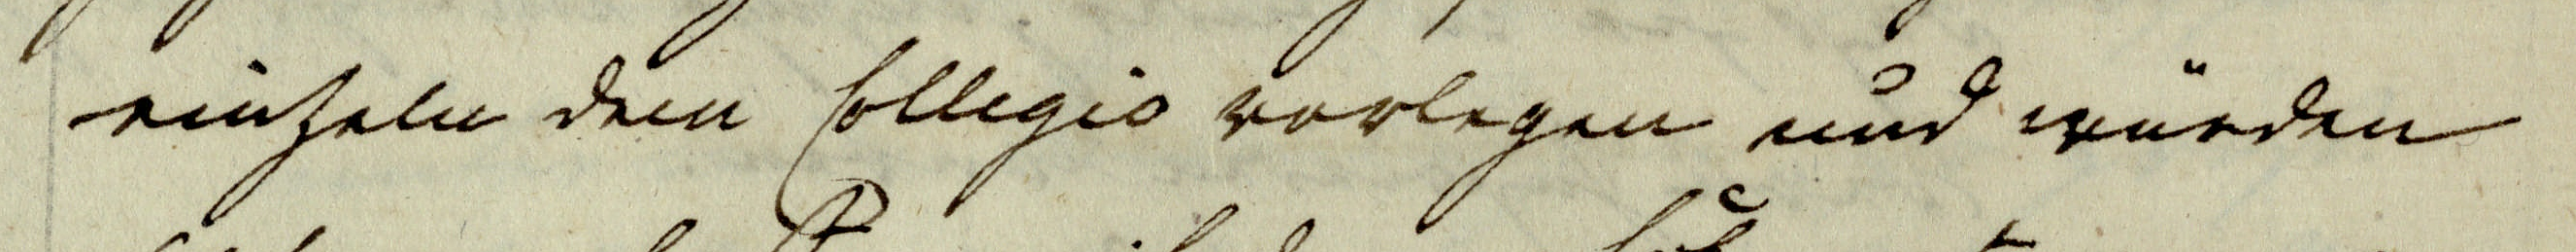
einzeln dem Collegio vorlegen und würden
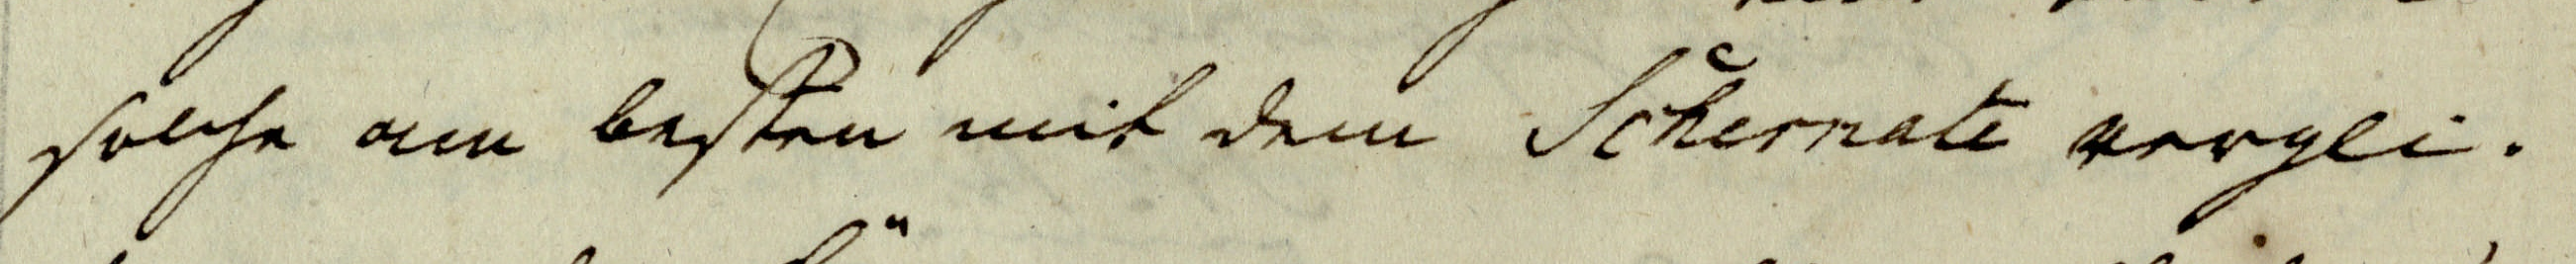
solche am besten mit dem Schemate vergli¬
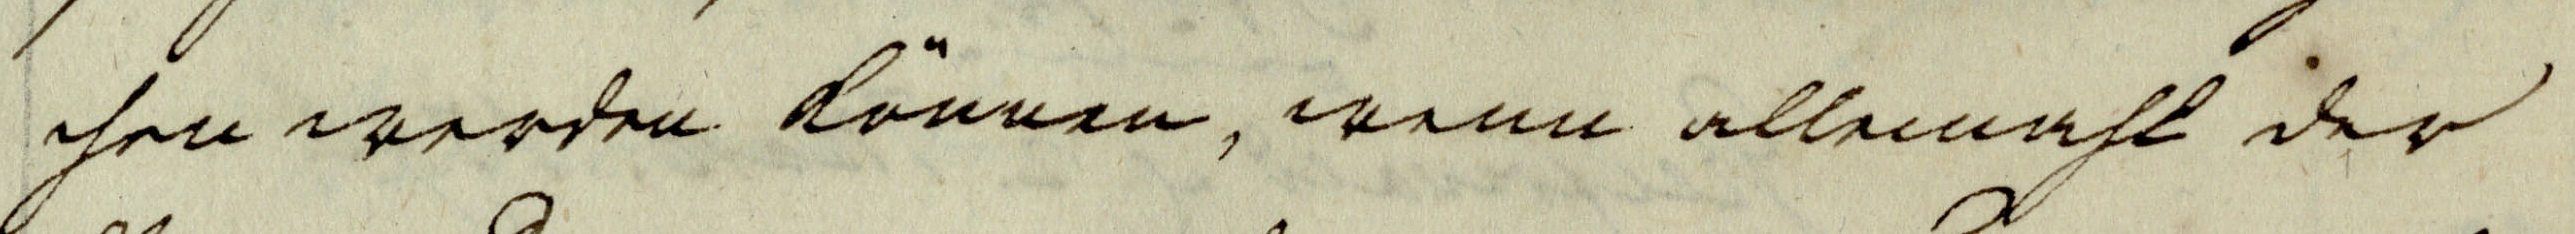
chen werden können, wenn allemahl der
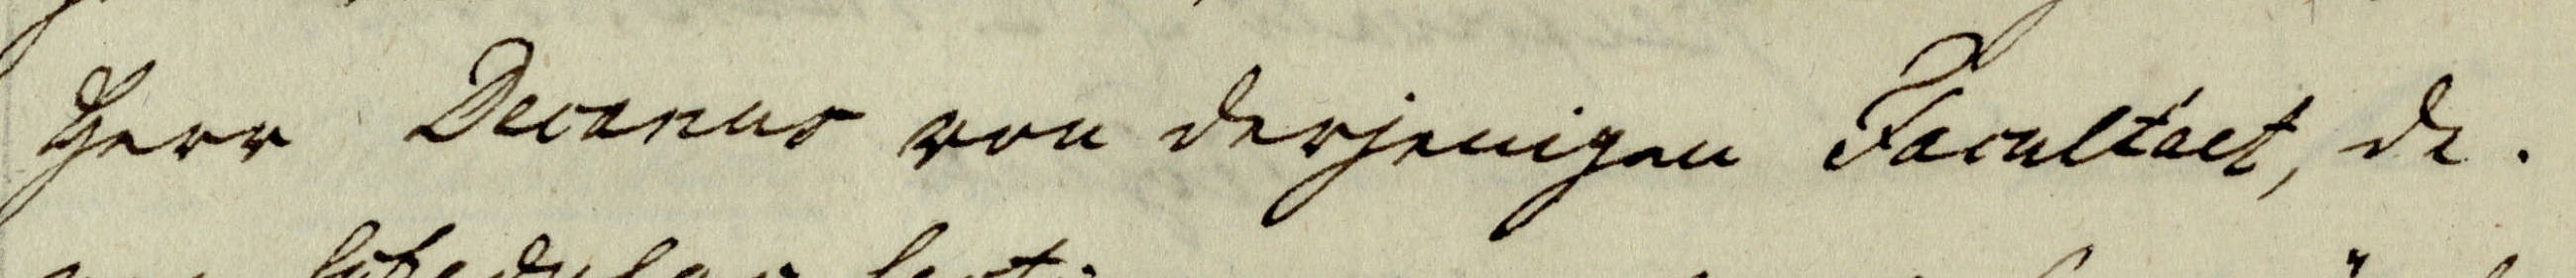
Herr Decanus von derjenigen Facultaet, de¬
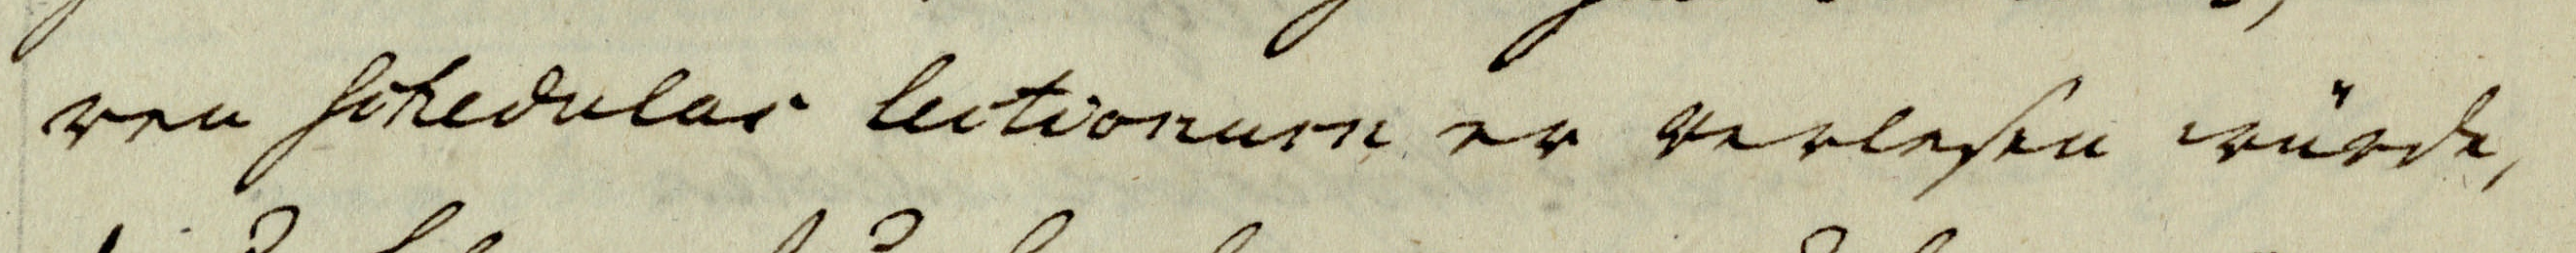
ren Schedulas lectionum er verlesen würde,
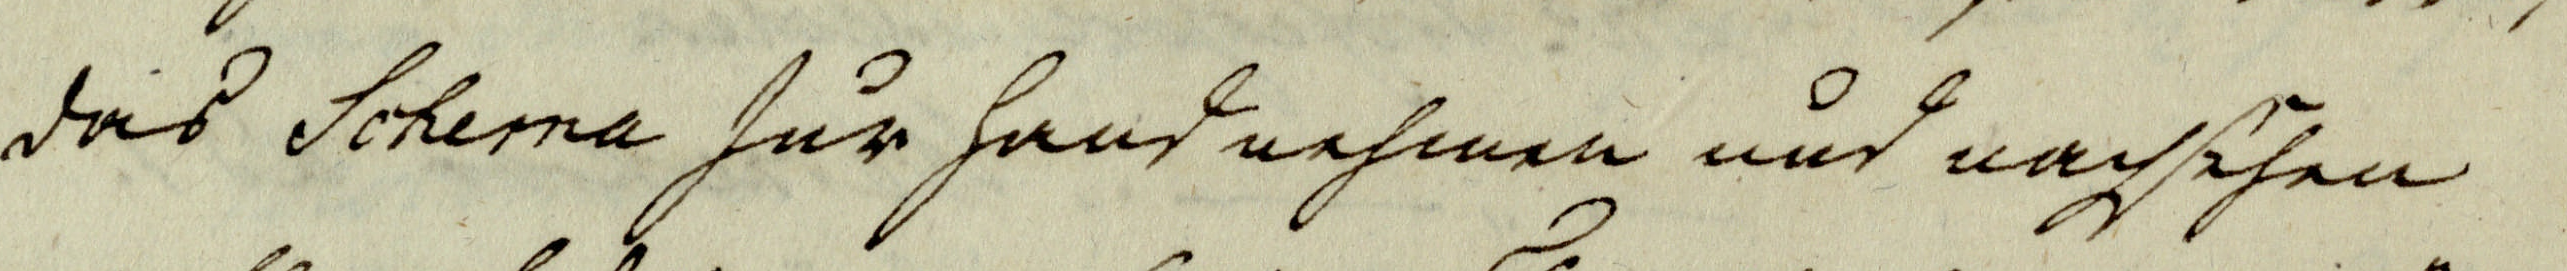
das Schema zur Hand nehmen und nachsehen
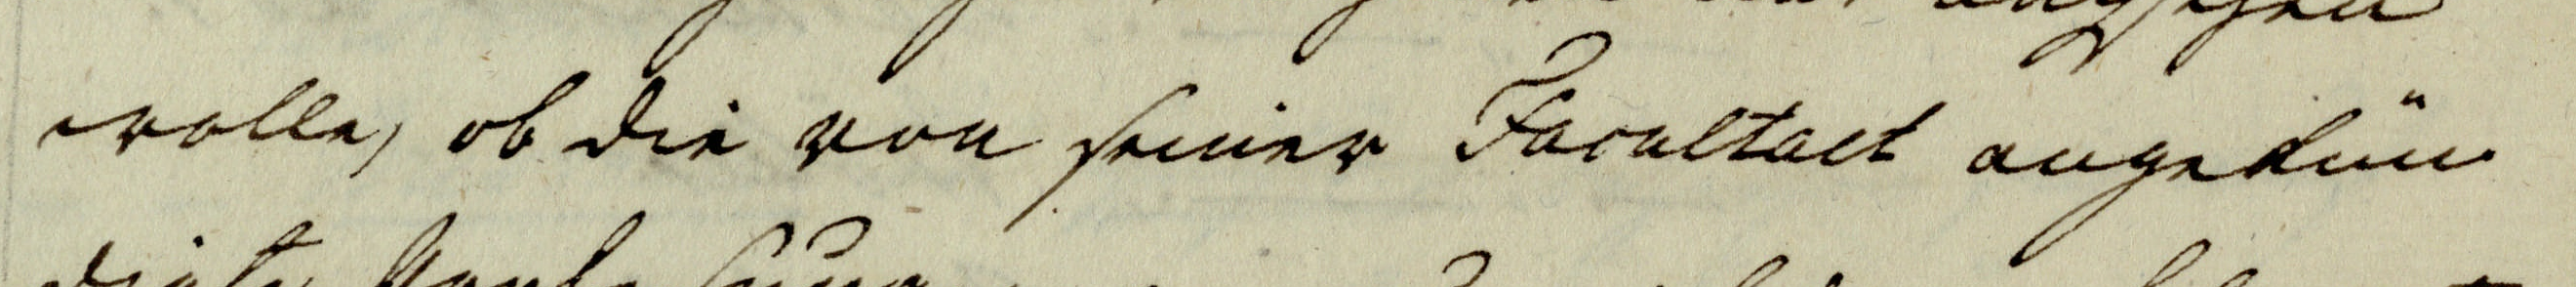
wolle, ob die von seiner Facultaet angekün¬
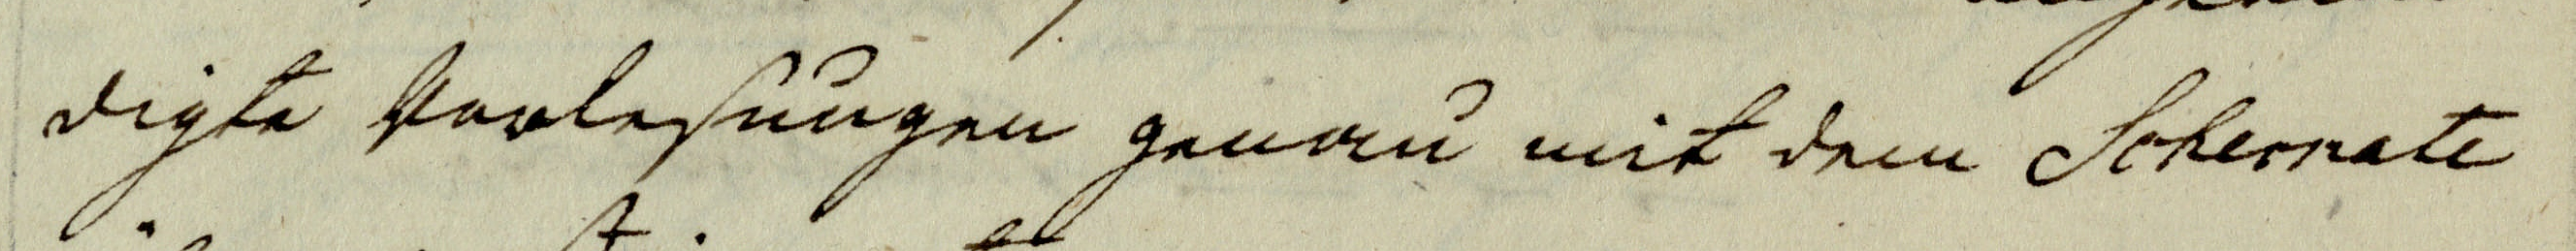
digte Vorlesungen genau mit dem Schemate
